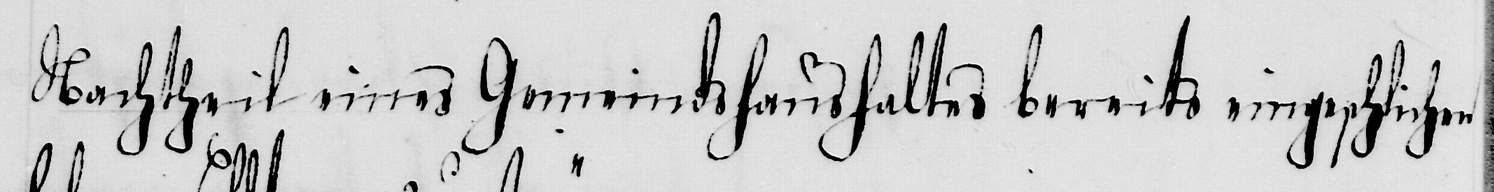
Nachtheil eines Gemeindshaushaltes bereits eingeschlich¬
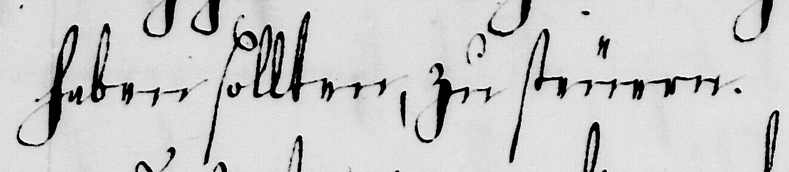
haben sollten, zu steuern.
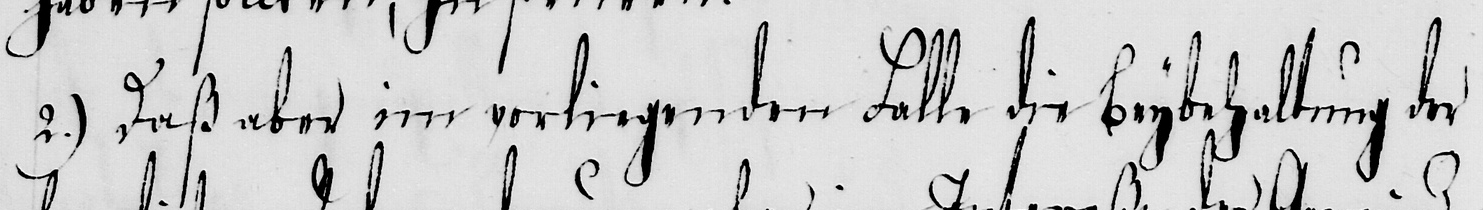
2.) Daß aber im vorliegenden Falle die Beybehaltung d¬
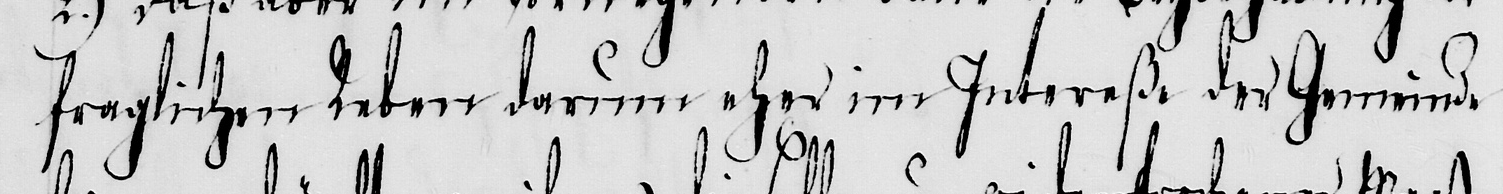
fraglichen Reben darum eher im Intereße der Gemeinde
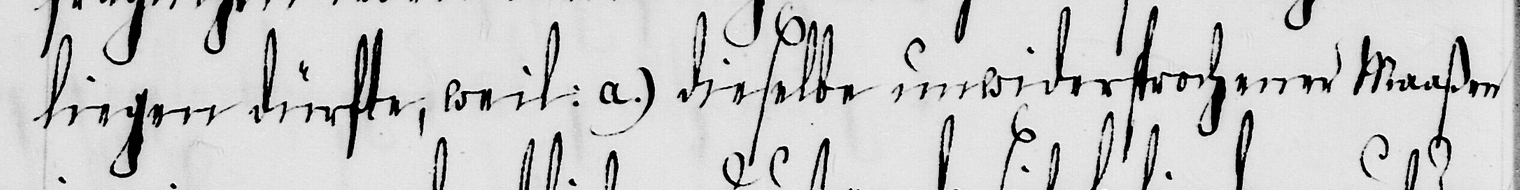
liegen dürfte, weil: a.) dieselbe unwidersprochener Maaßen
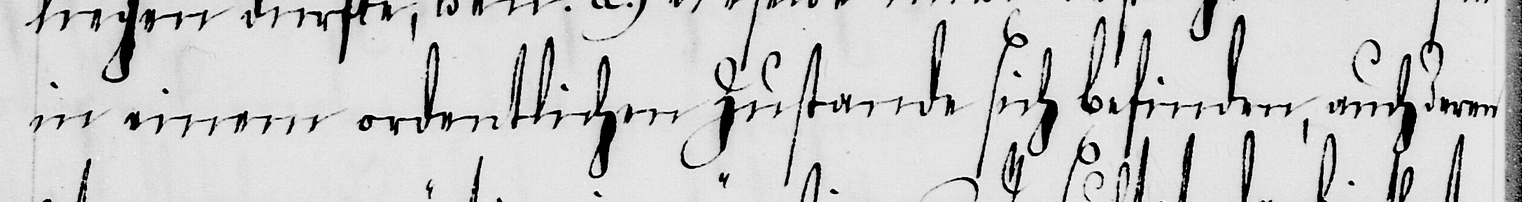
in einem ordentlichen Zustande sich befinden, auch d¬
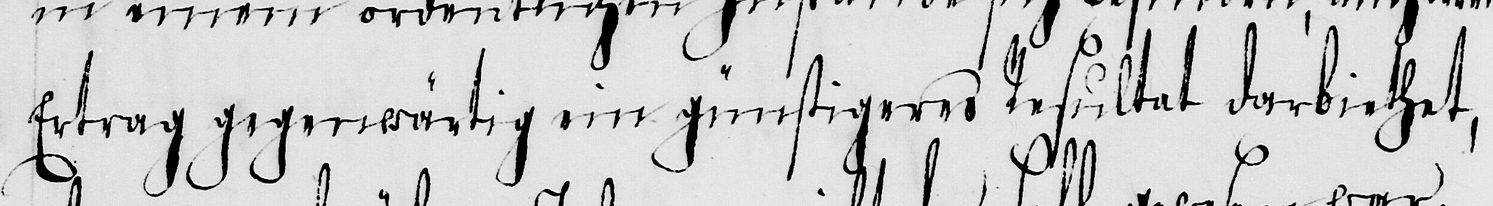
Ertrag gegenwärtig ein günstigeres Resultat darbiethet,
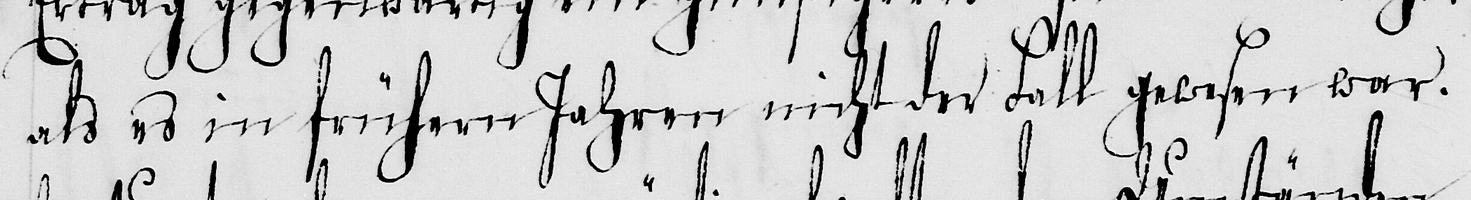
als es in frühern Jahren nicht der Fall gewesen war.
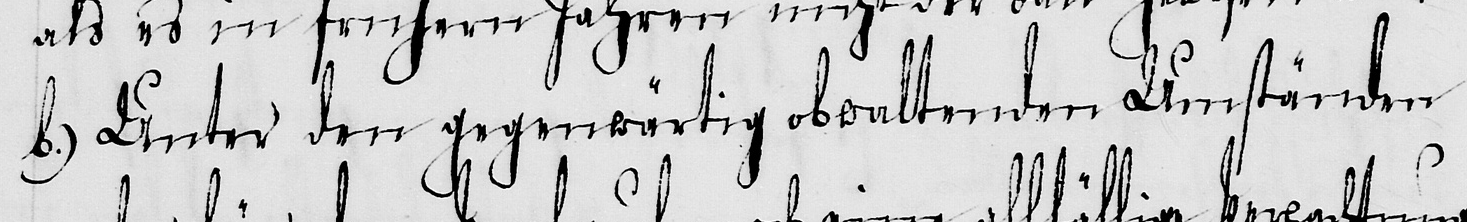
b.) Unter den gegenwärtig obwaltenden Umständen
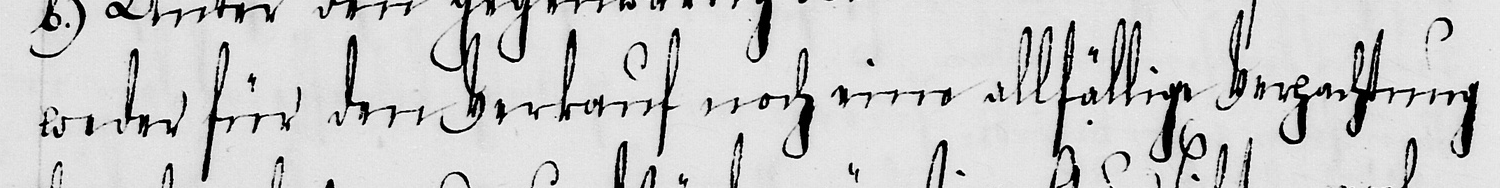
weder für den Verkauf noch eine allfällige Verpachtung
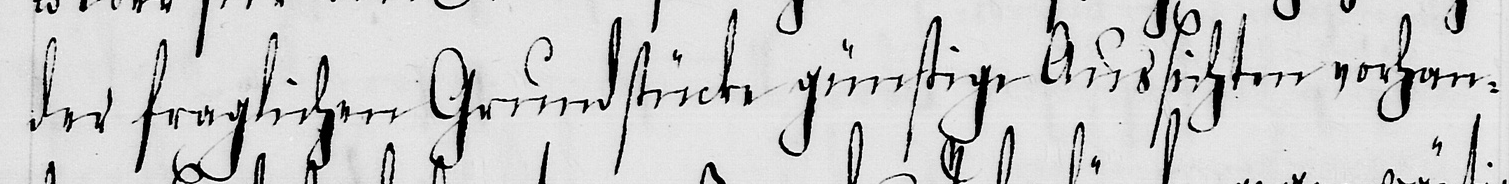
der fraglichen Grundstücke günstige Aussichten vorhan¬
